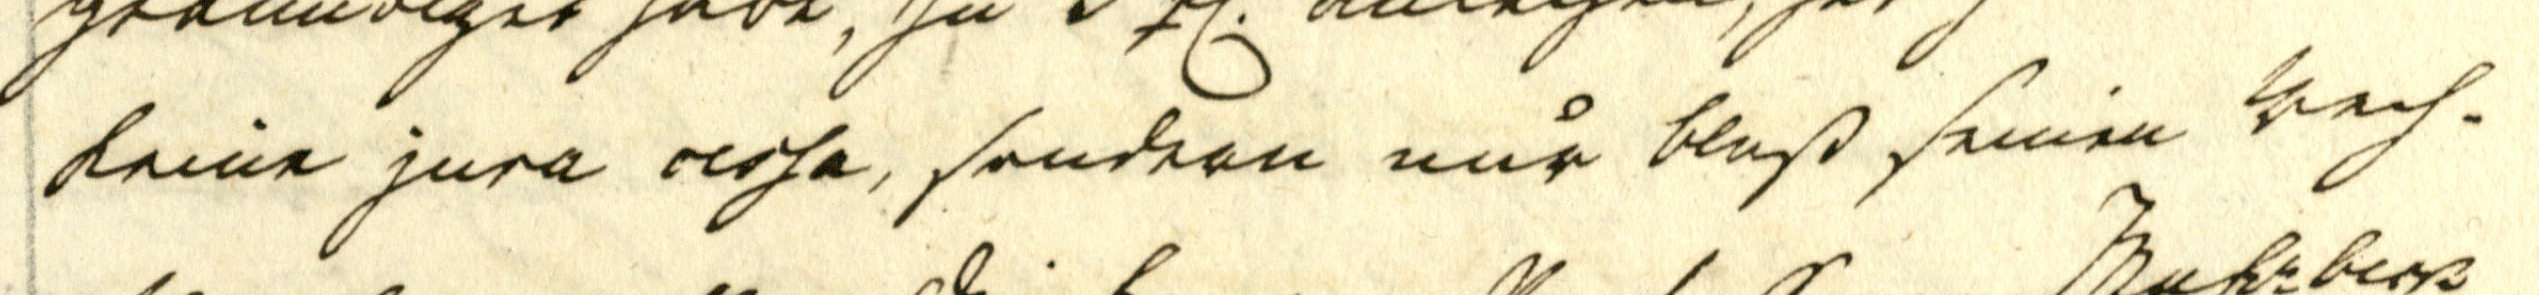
keine jura cessa, sondern nur bloß seinen Wech¬
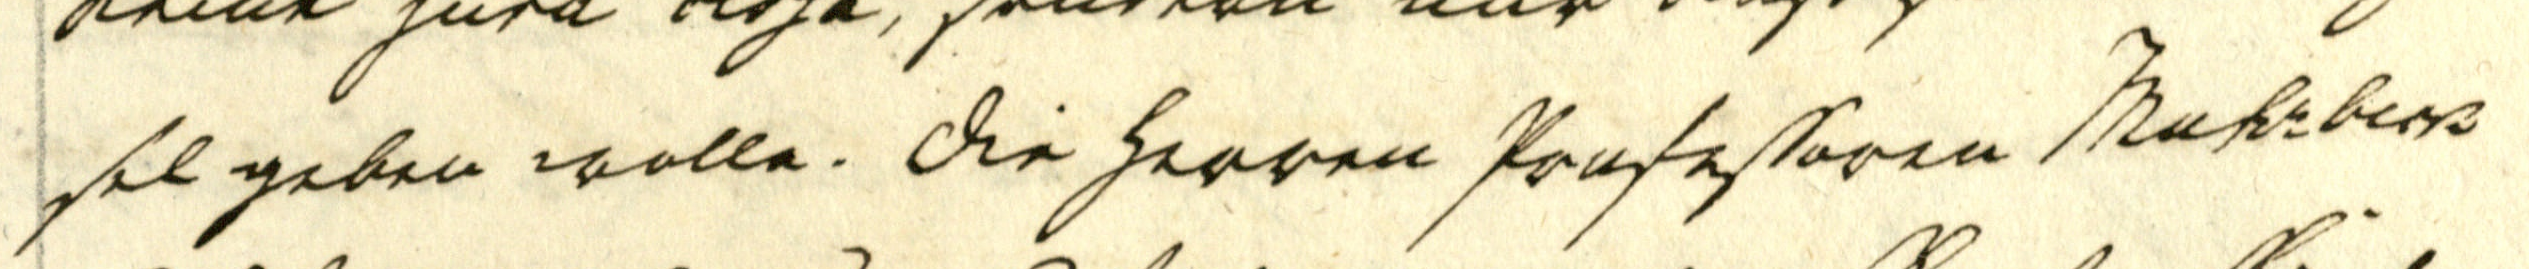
sel geben wolle. Die Herren Professoren Muhrbeck
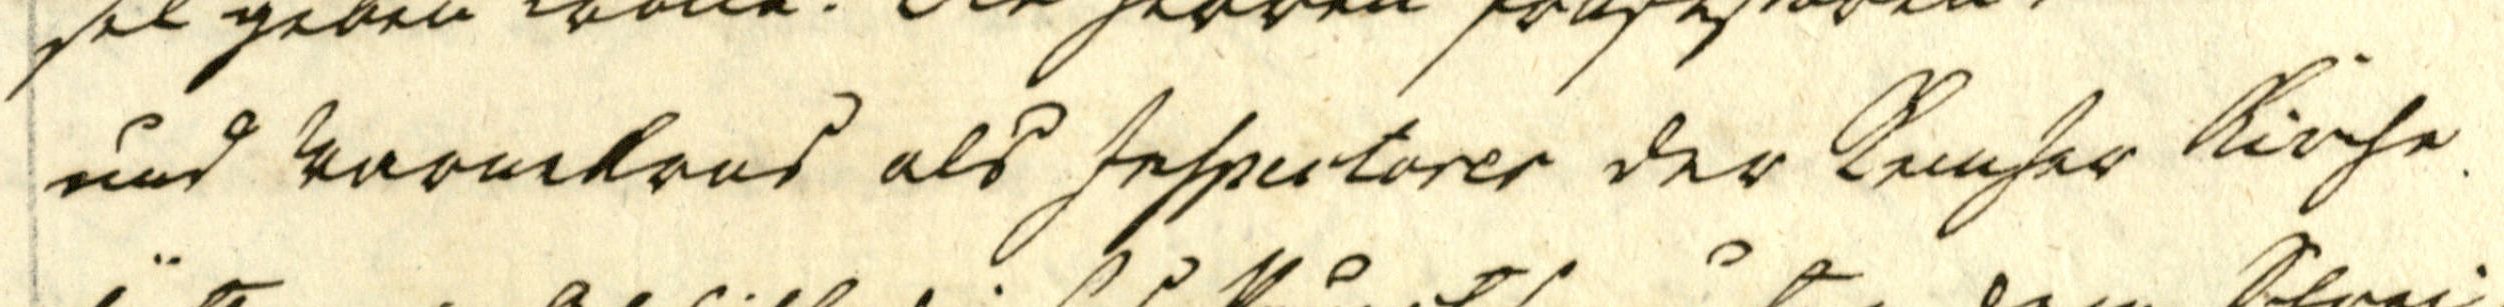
und Warnekros als Inspectores der Kenzer Kirche
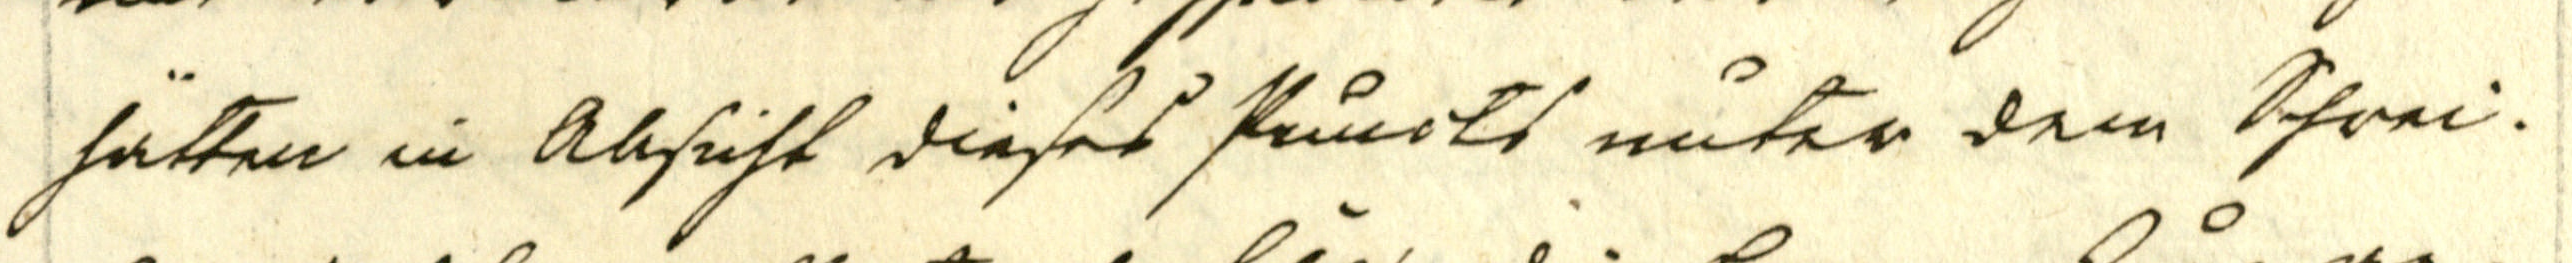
hätten in Absicht dieses Puncts unter dem Schrei¬
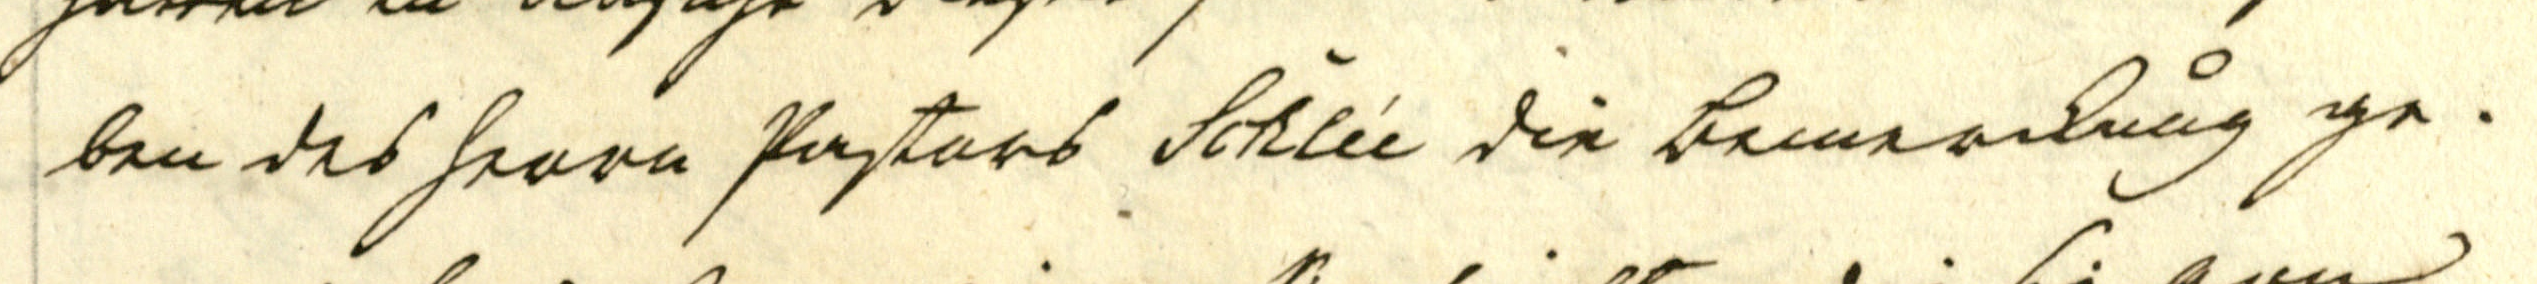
ben des Herrn Pastors Schlée die Bemerckung ge¬
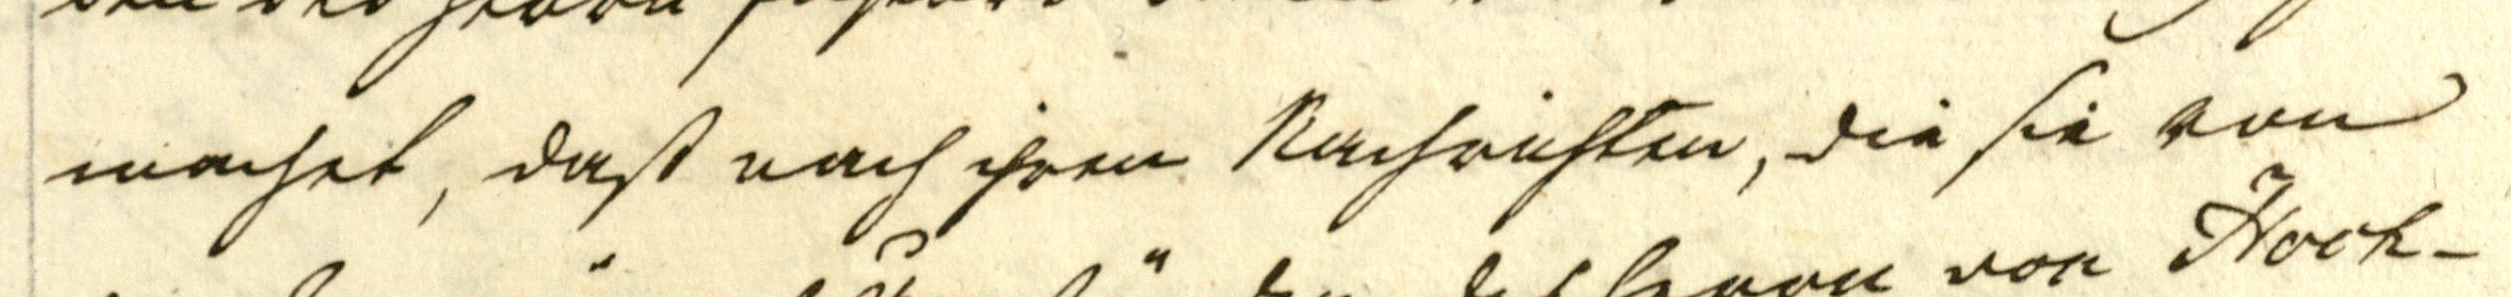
machet, daß nach ihren Nachrichten, die sie von
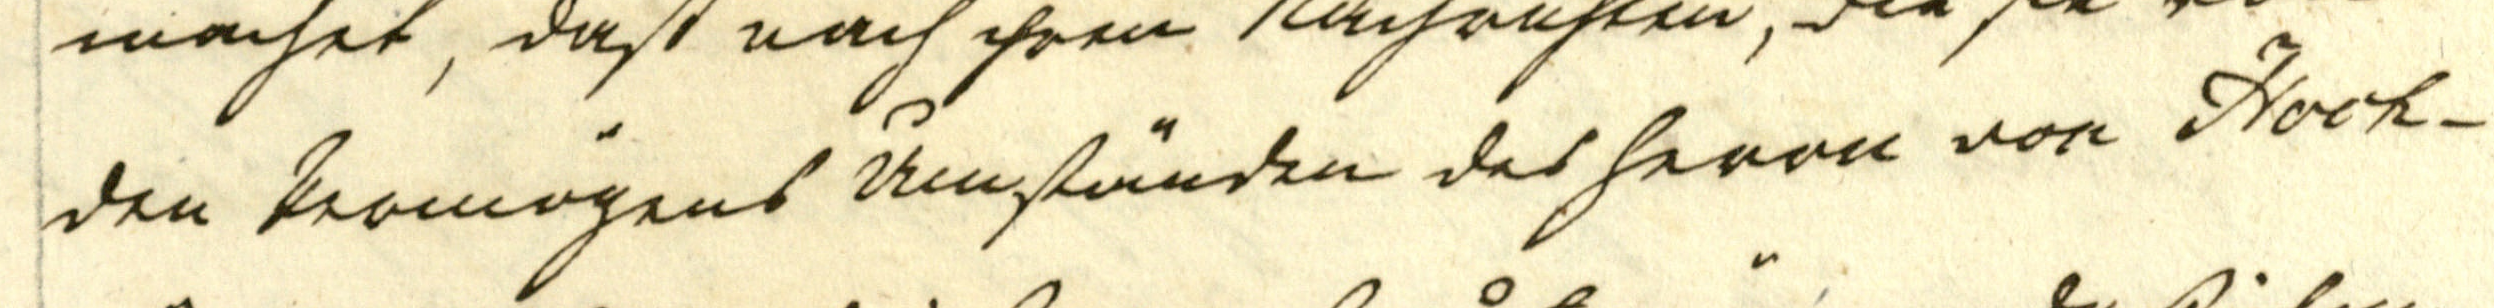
den Vermögens Umständen des Herrn von Hoch¬
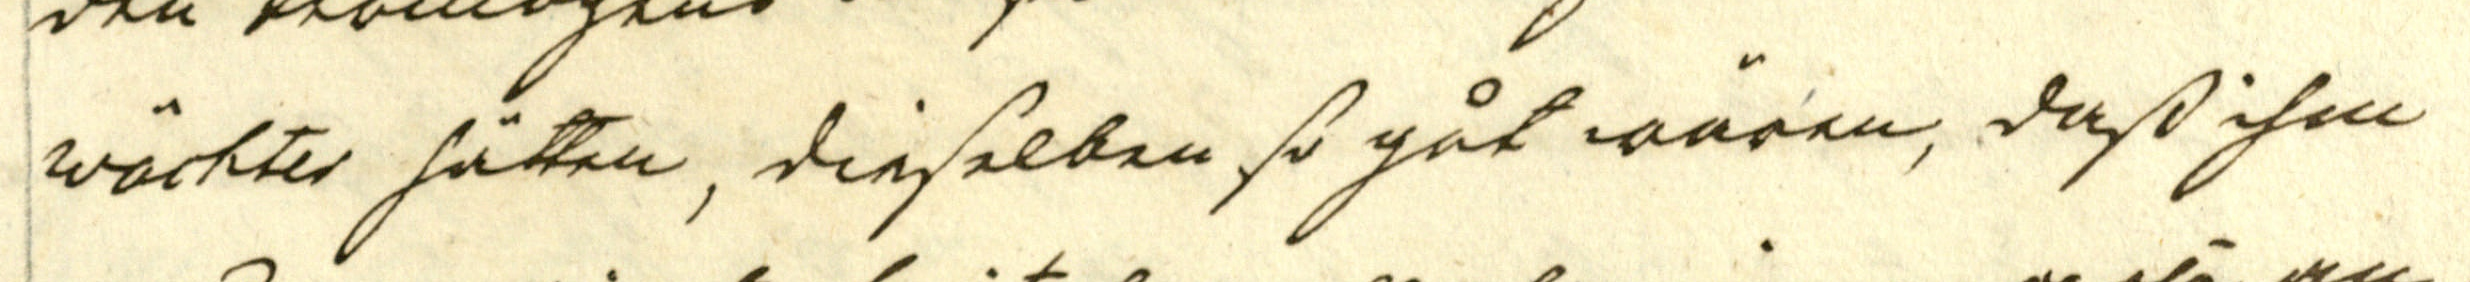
wächter hätten, dieselben so gut wären, daß ihm
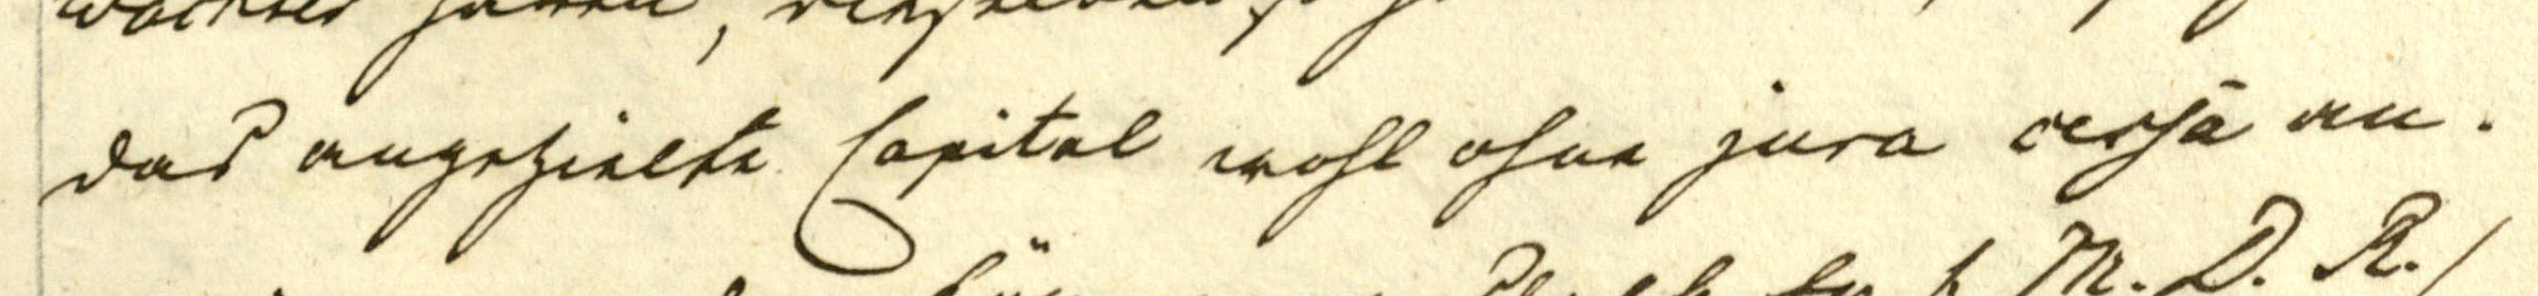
das angezielte Capital wohl ohne jura cessa an¬
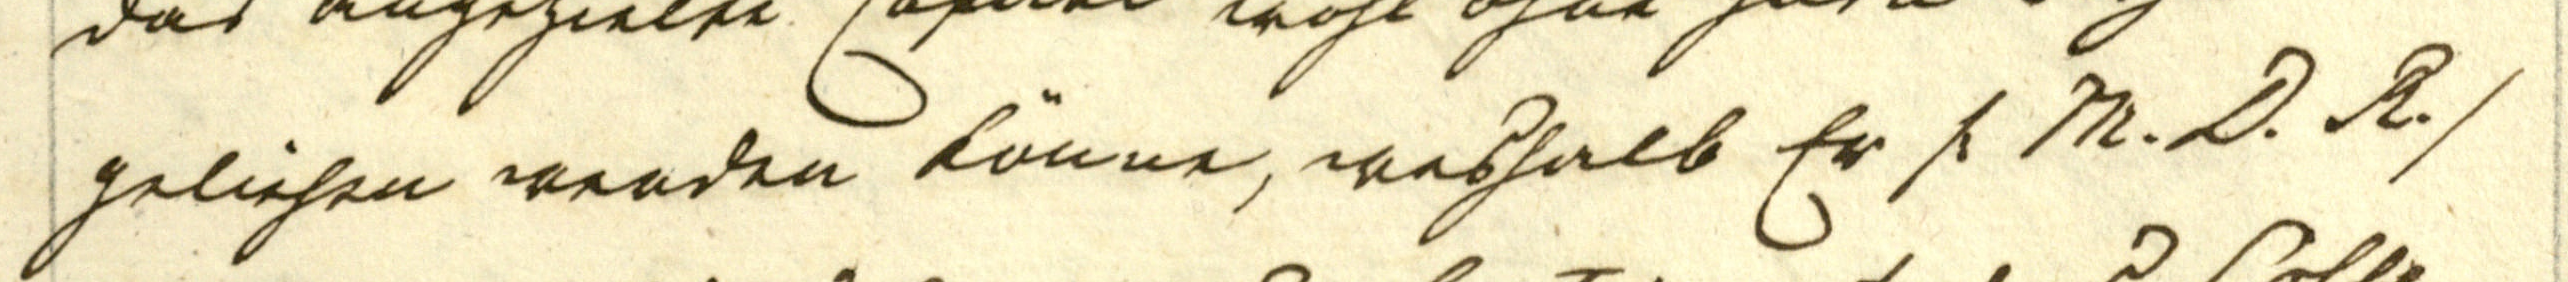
geliehen werden könne, weshalb Er /M. D. R./
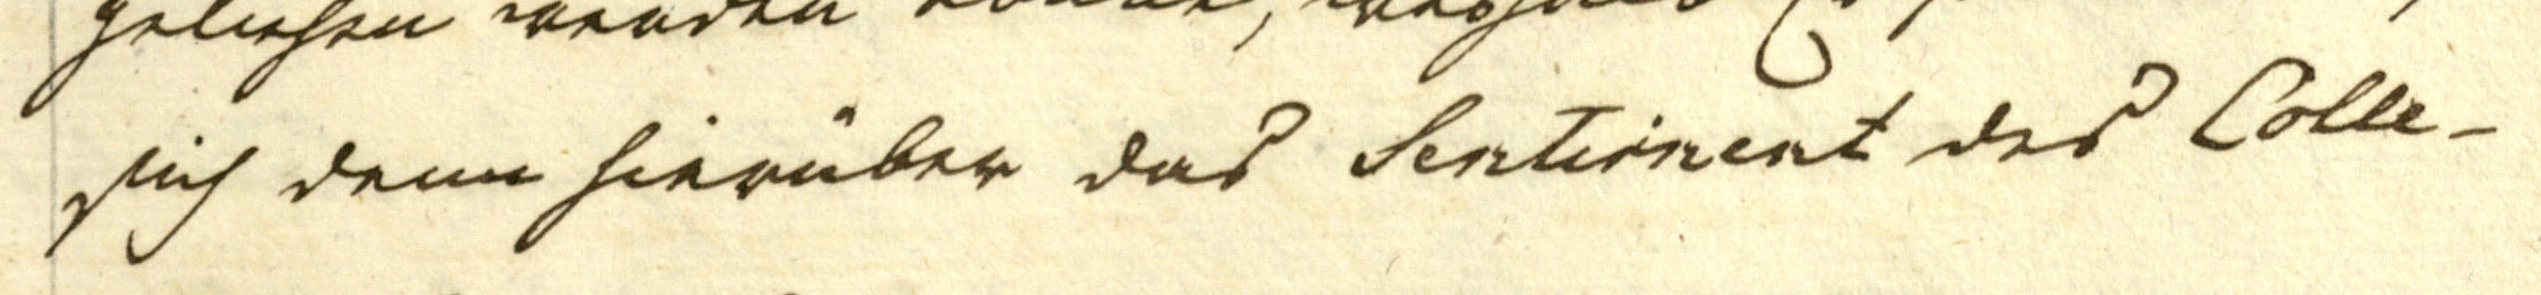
sich denn hierüber das Sentiment des Colle-
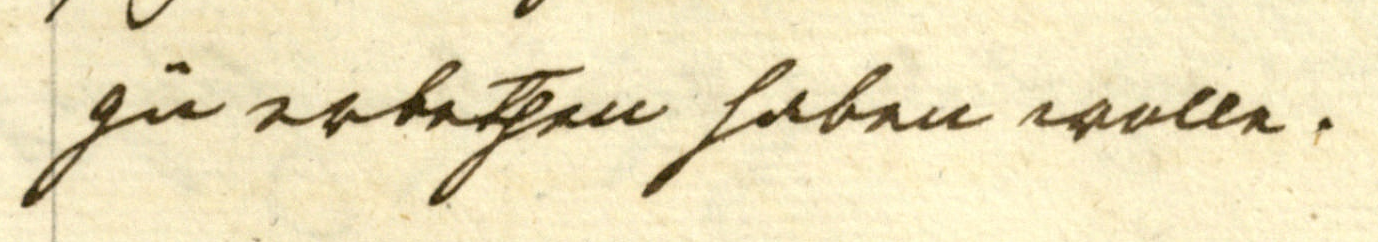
gii erbethen haben wolle.
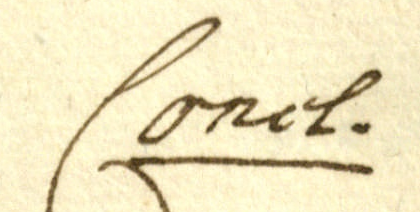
Concl.
